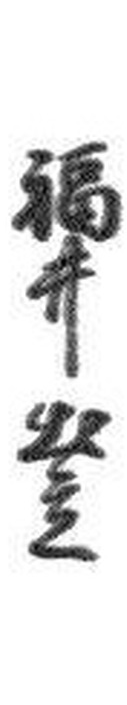福井出立

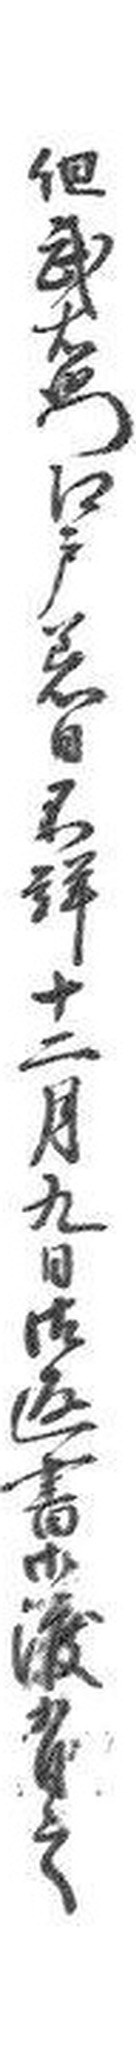但武右衛門江戸着不詳十二月九日御返書御渡有之
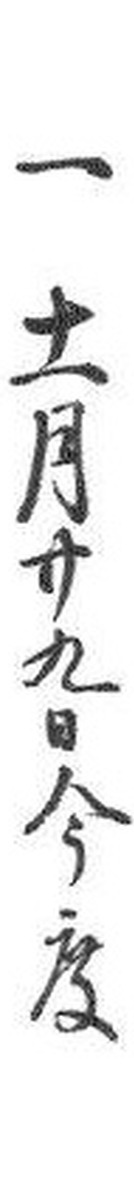一十一月廿九日今度
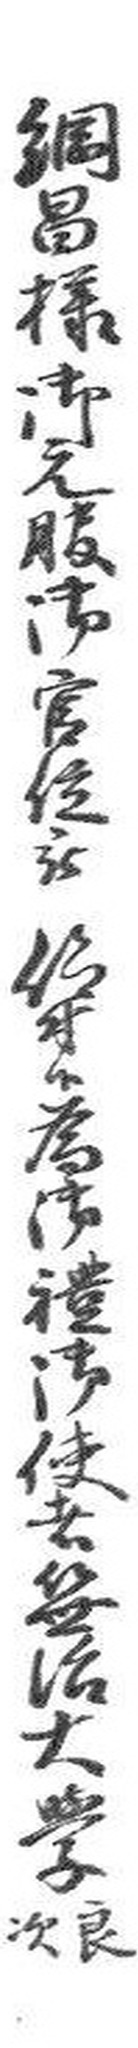綱昌様御元服御官位被仰付候為御礼御使者笹治大学良次
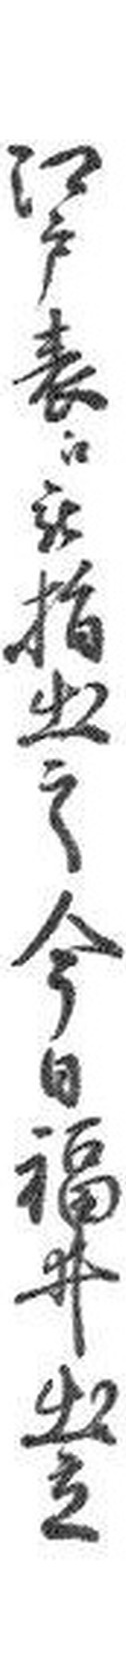江戸表江被指出之今日福井出立
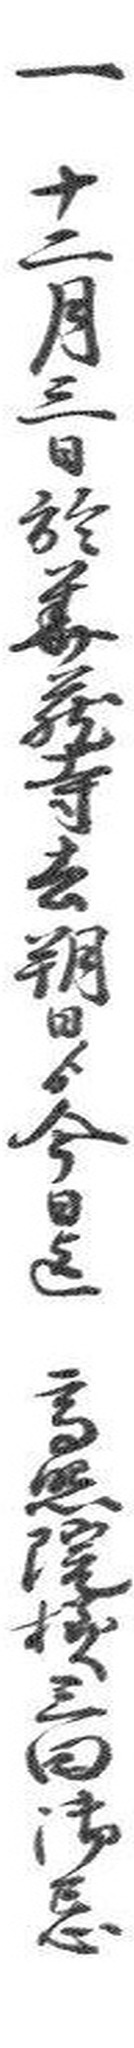一十二月三日於華蔵有之寺去朔日ゟ今日迄高照院様三回御忌
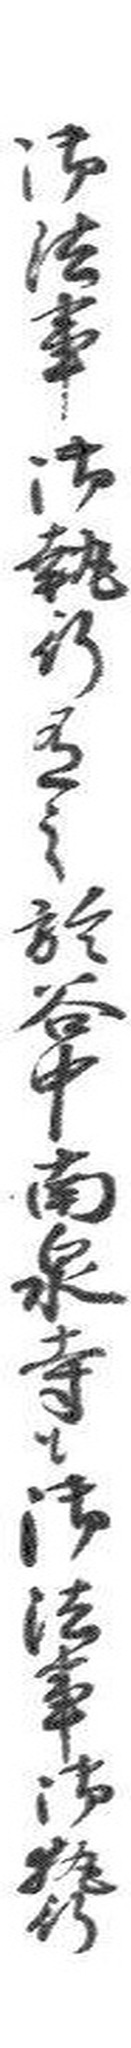御法事御執行有之於谷中南泉寺も御法事御執行
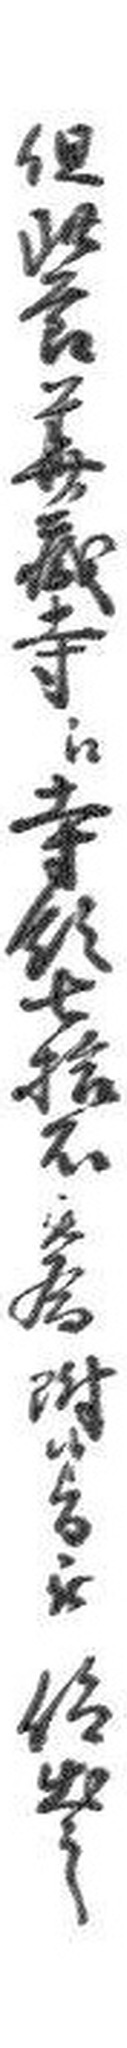但此節華蔵寺江寺領七拾石被為附候旨被仰出之
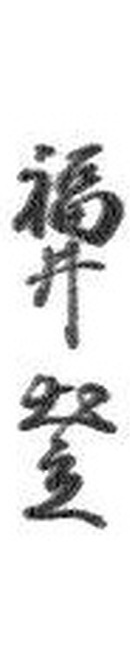福井出立
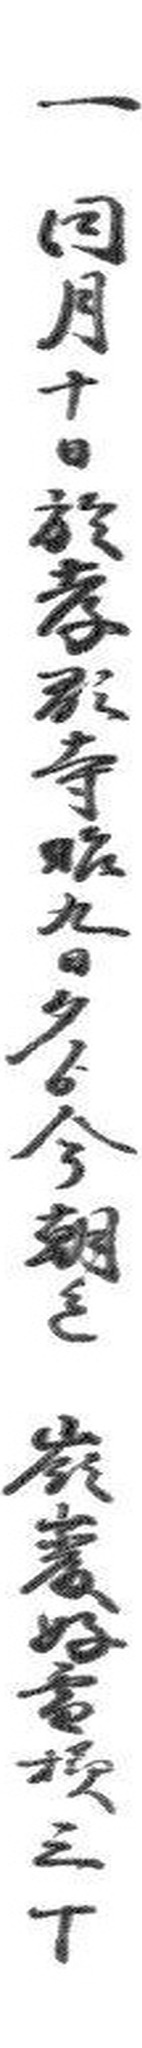一同月十日於孝顕寺昨九日夕ゟ今朝迄巌好雷様三十
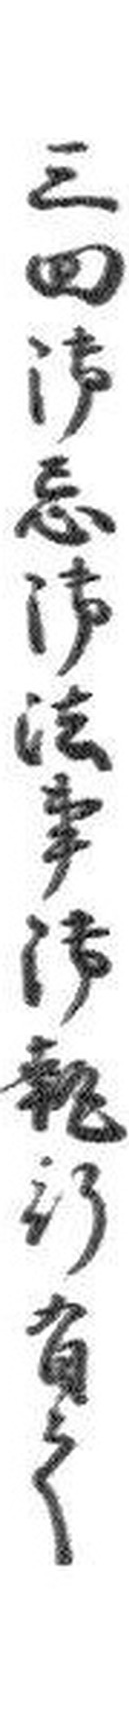三回御忌御法事御執行有之
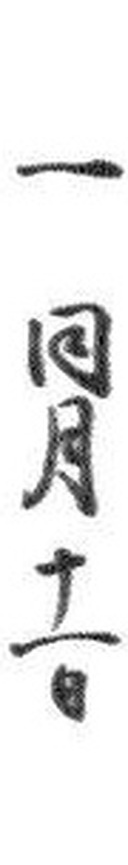一同月十一日
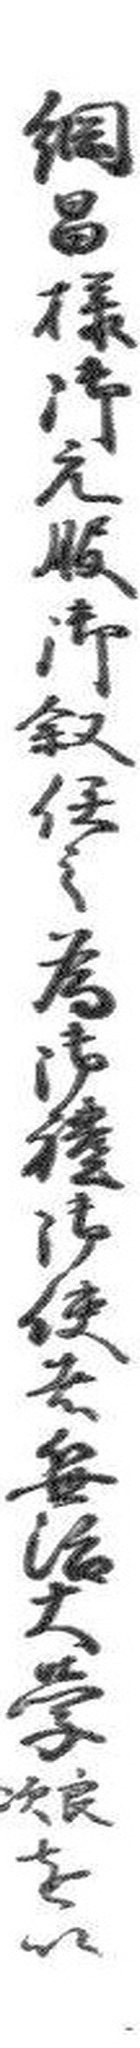綱昌様御元服御叙任為御礼御使者笹治大學良次を以
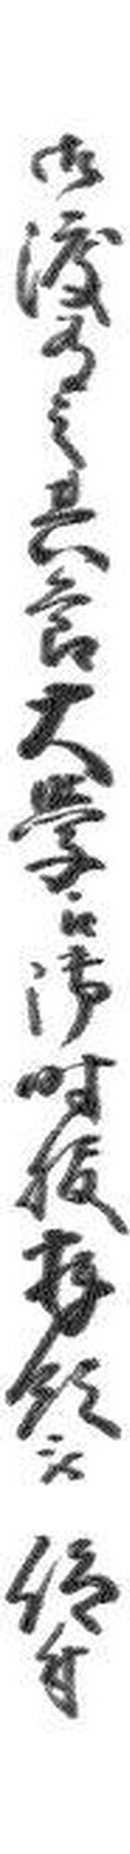御渡有之其節大学江御時服拝領被仰付
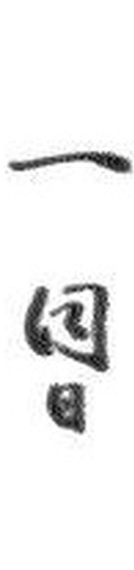一同日

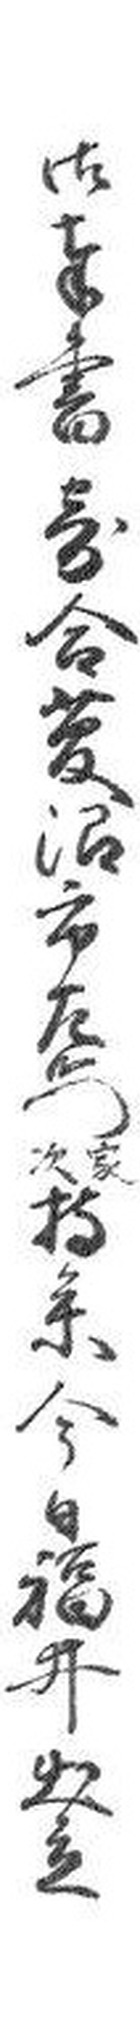御奉書寄合菱沼市左衛門家次持参今日福井出立
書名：家譜 十一 昌親公 従延宝二年到延宝四年八月
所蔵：福井県文書館 Fukui Prefectural Archives
